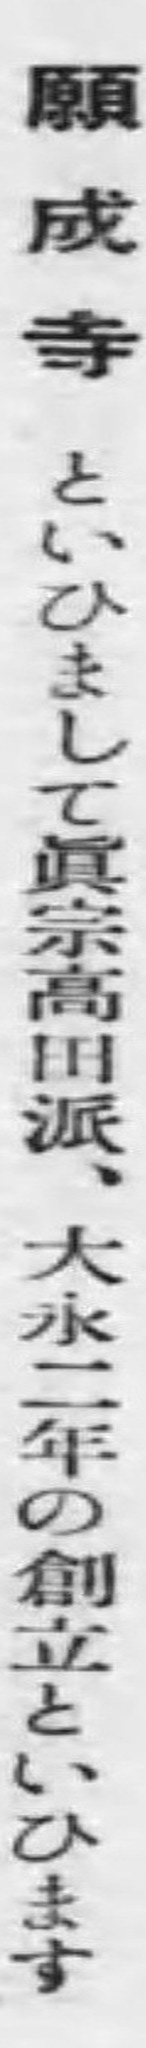願成寺といひまして真宗高田派、大永二年の創立といひます
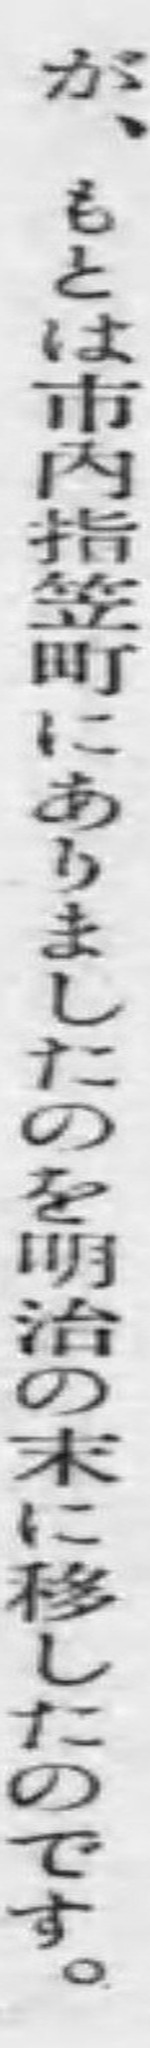が、もとは市内指笠町にありましたのを明治の末に移したのです。
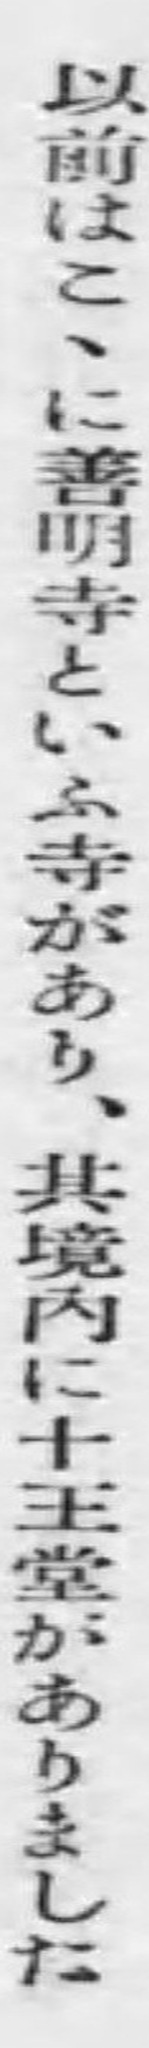以前はこゝに善明寺といふ寺があり、其境内に十王堂がありました
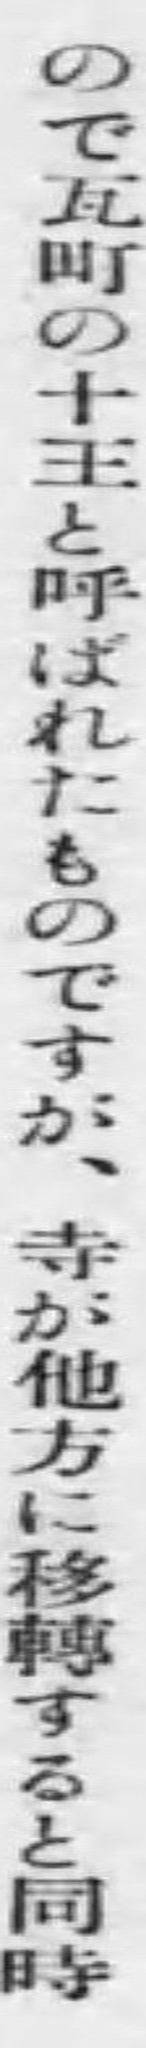ので瓦町の十王と呼ばれたものですが、寺が他方に移転すると同時
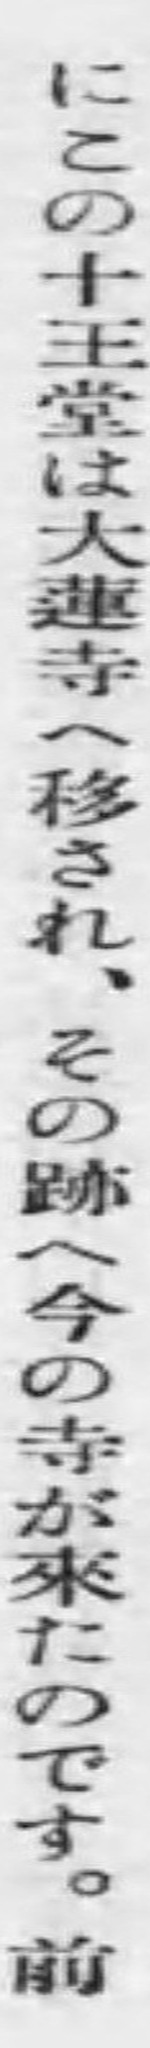にこの十王堂は大蓮寺へ移され、その跡へ今の寺が来たのです。前
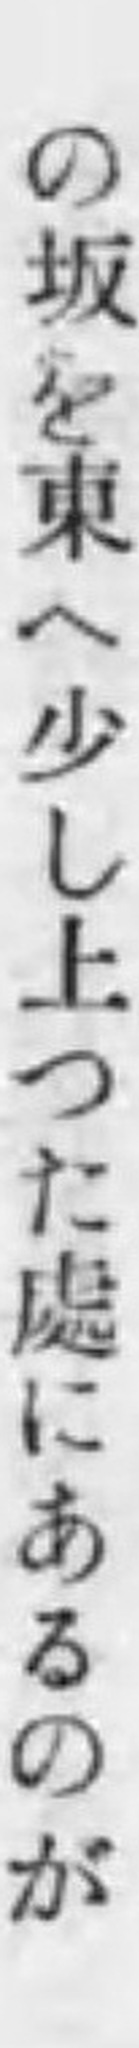の坂を東へ少し上つた処にあるのが

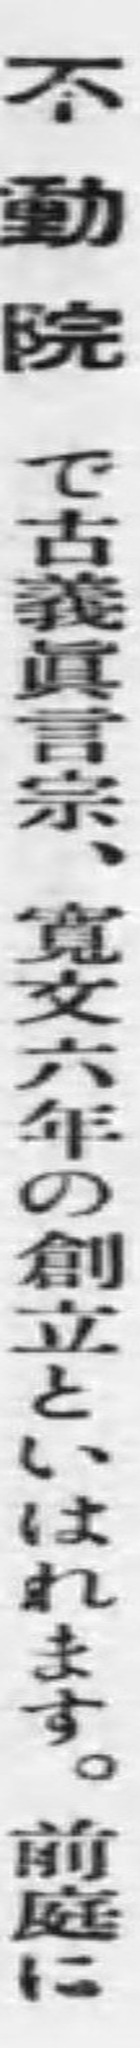不動院で古義真言宗、寛文六年の創立といはれます。前庭に
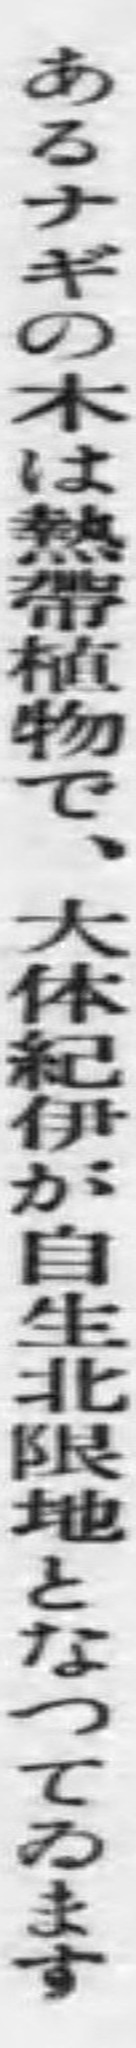あるナギの木は熱帯植物で、大体紀伊が自生北限地となつてゐます
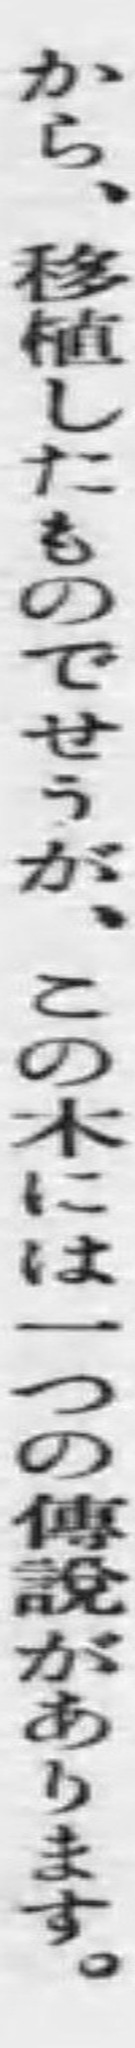から、移植したものでせうが、この木には一つの伝説があります。
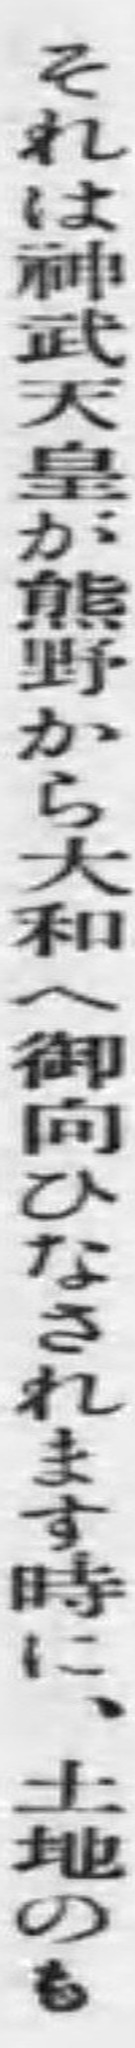それは神武天皇が熊野から大和へ御向ひなされます時に、土地のも
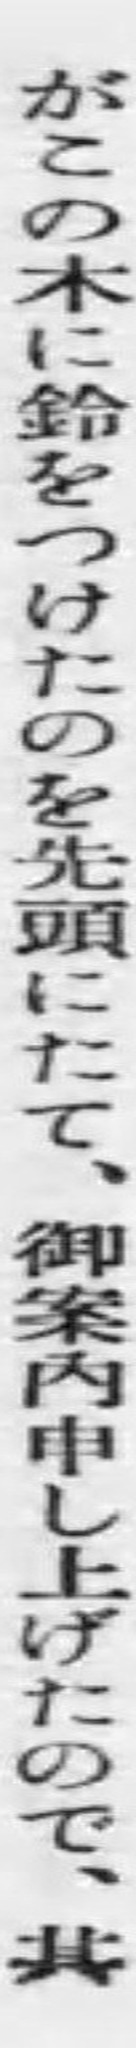がこの木に鈴をつけたのを先頭にたて、御案内申し上げたので、其
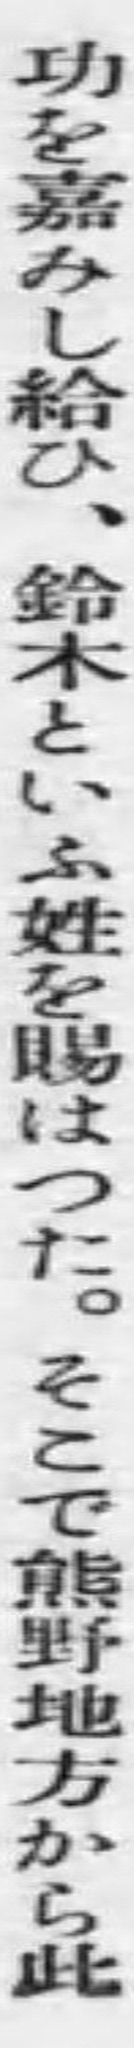功を嘉みし給ひ、鈴木といふ姓を賜はつた。そこで熊野地方から此
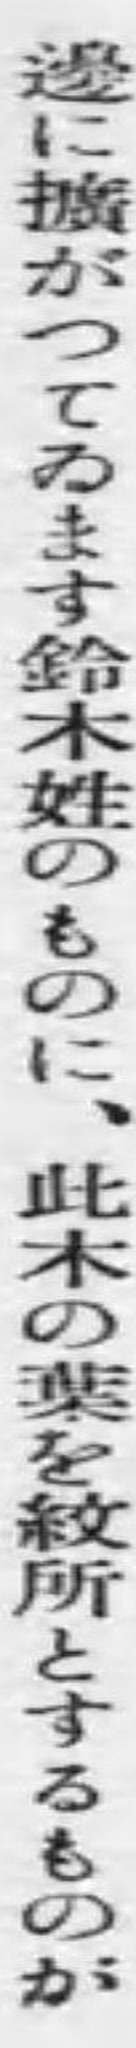辺に拡がつてゐます鈴木姓のものに、此木の葉を紋所とするものが
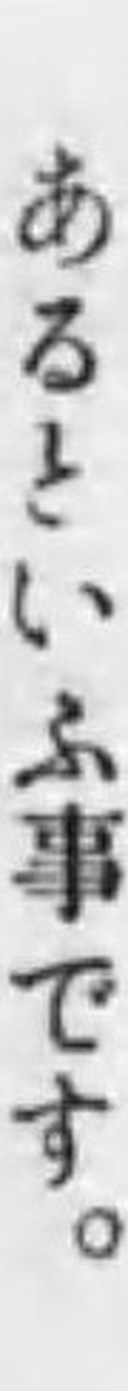あるといふ事です。
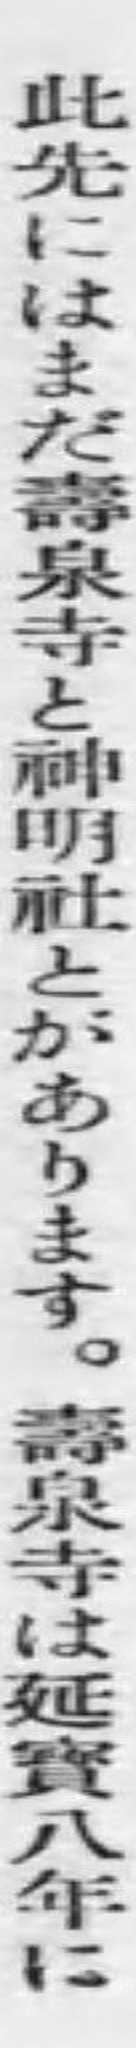此先にはまだ寿泉寺と神明社とがあります。寿泉寺は延宝八年に
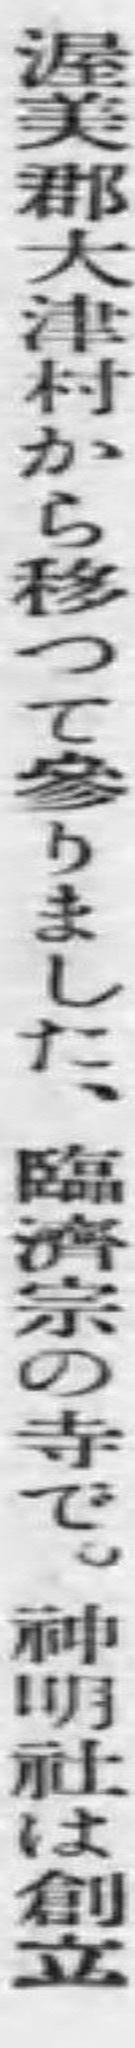渥美郡大津村から移つて参りました、臨済宗の寺で、神明社は創立
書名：東三河道中記 : 豊橋市及其附近案内
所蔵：国立国会図書館 National Diet Library, JAPAN
